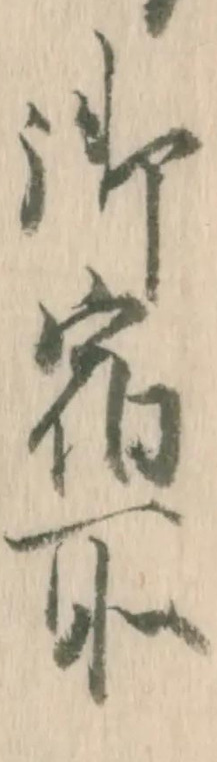御宿所
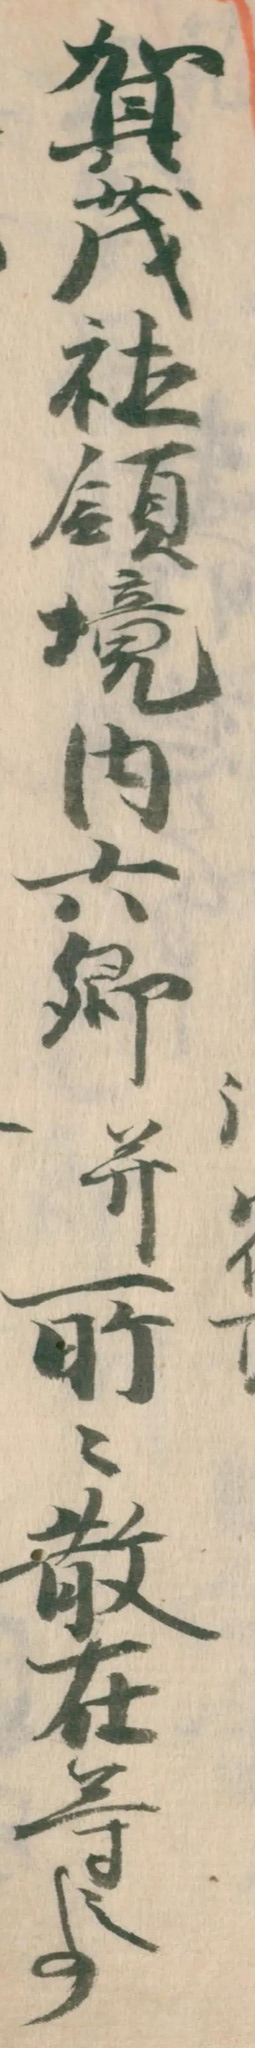賀茂社領境内六郷并所々散在等之事
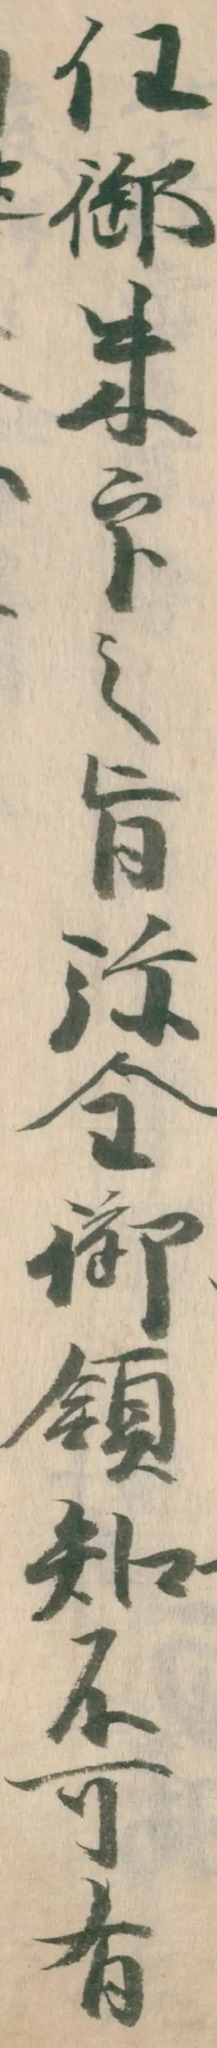任御朱印之旨弥全御領知不可有

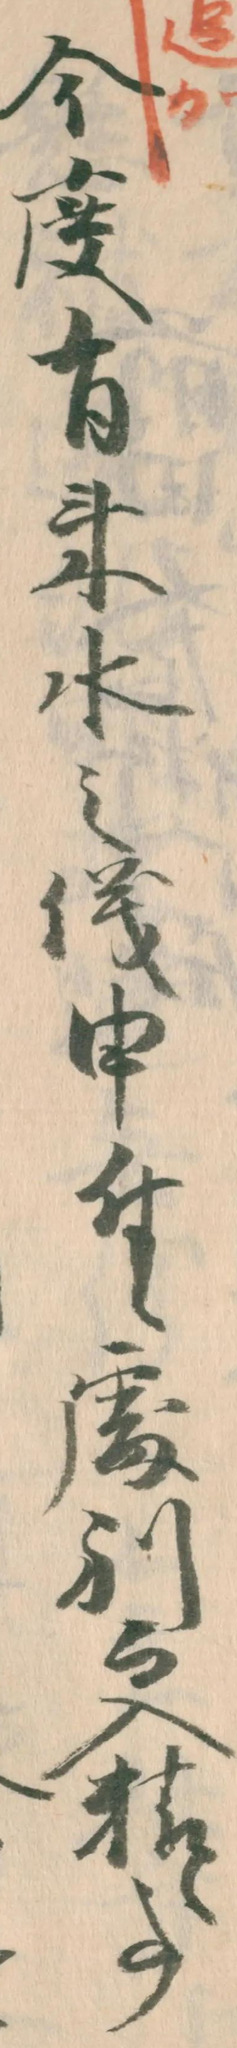今度有来水之儀申付候処別而入精候事
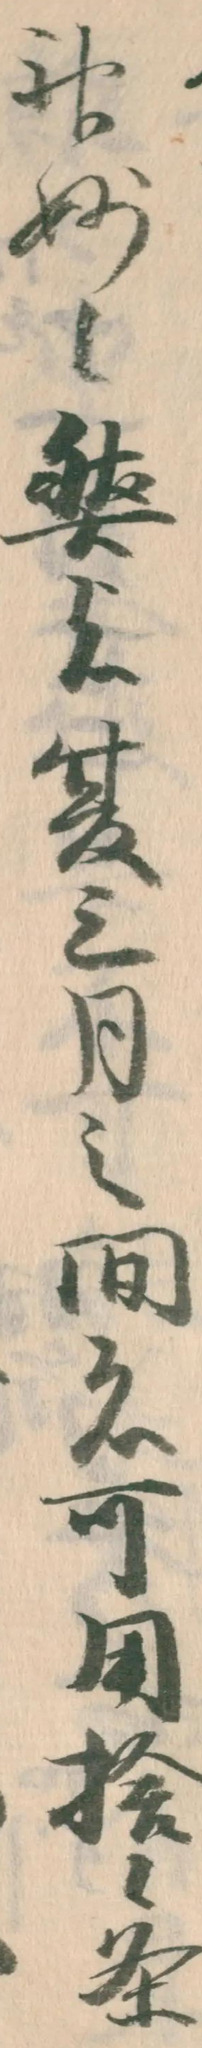神妙候然者夏三月之間者可用捨候条
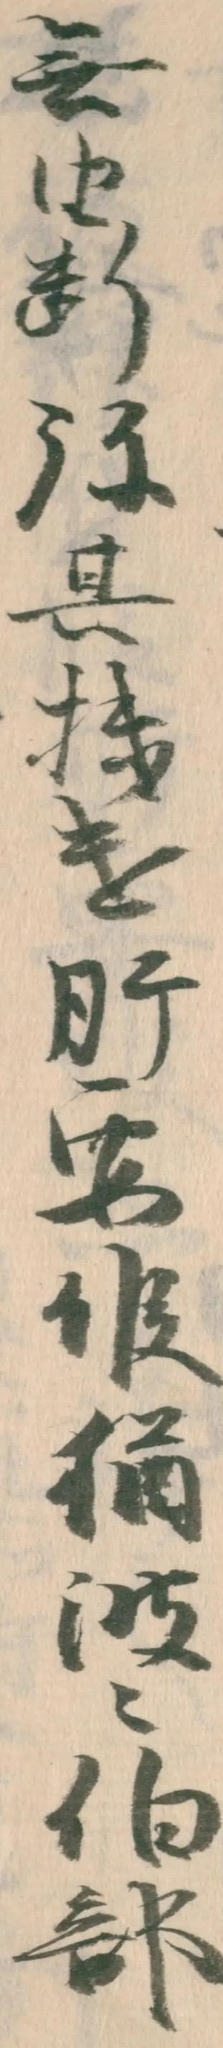無由断弥其機遣肝要候猶波々伯部
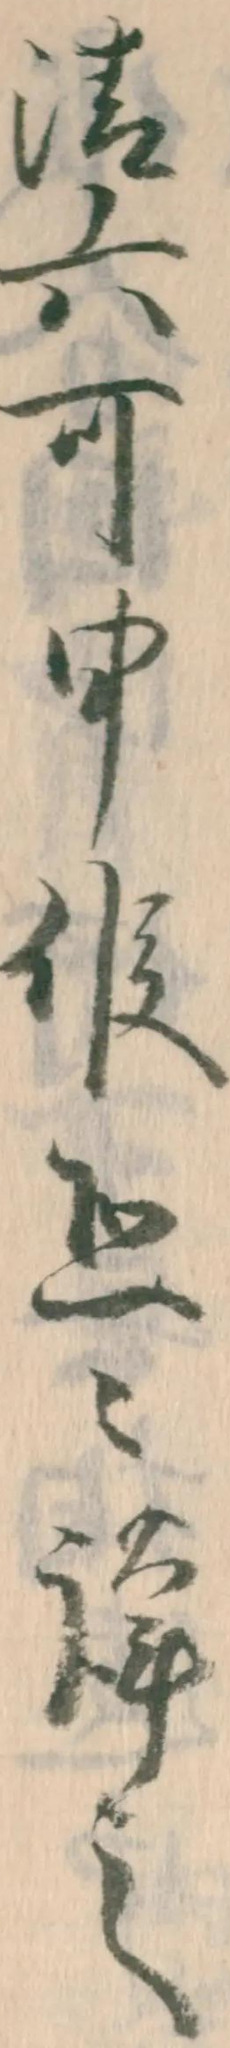清六可申候恐々謹言
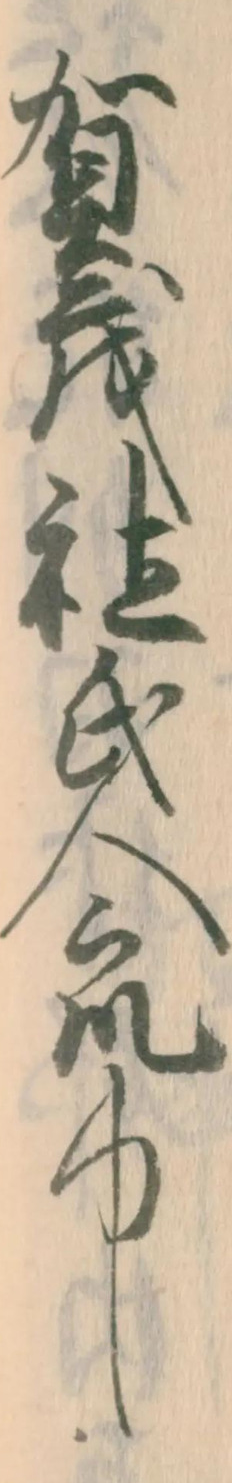賀茂社氏人衆中
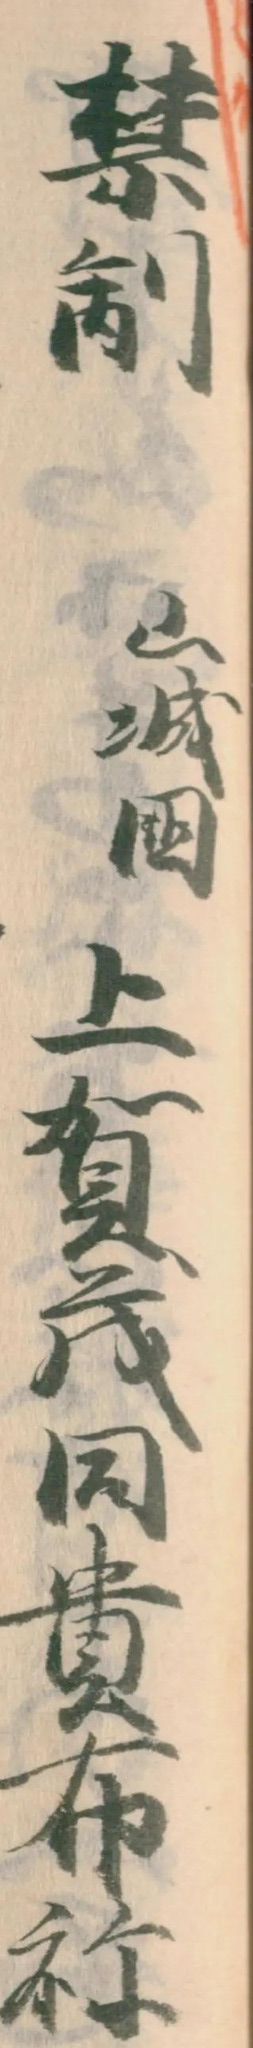禁制山城国上賀茂同貴ふね
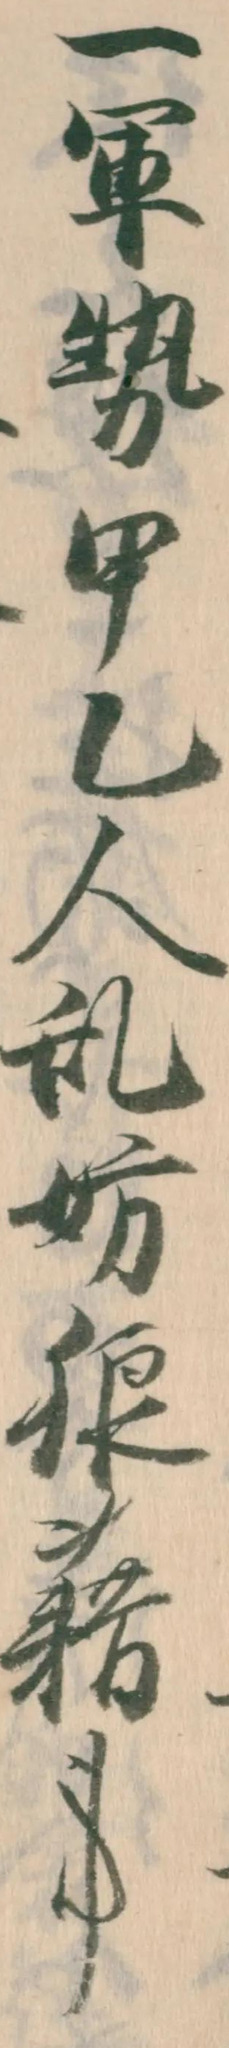一軍勢甲乙人乱妨狼藉事
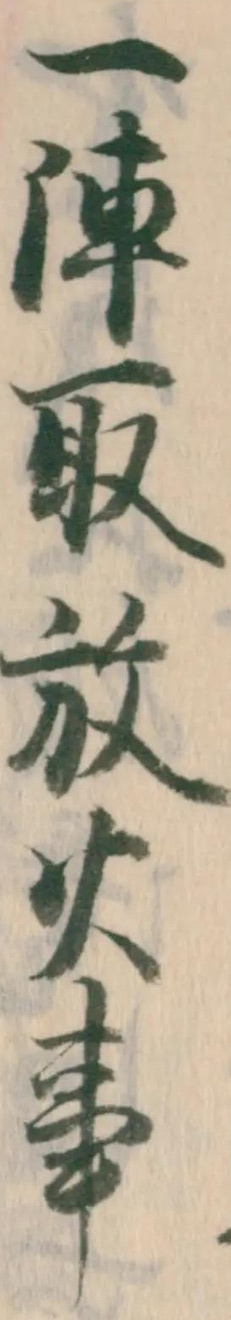一陣取放火事
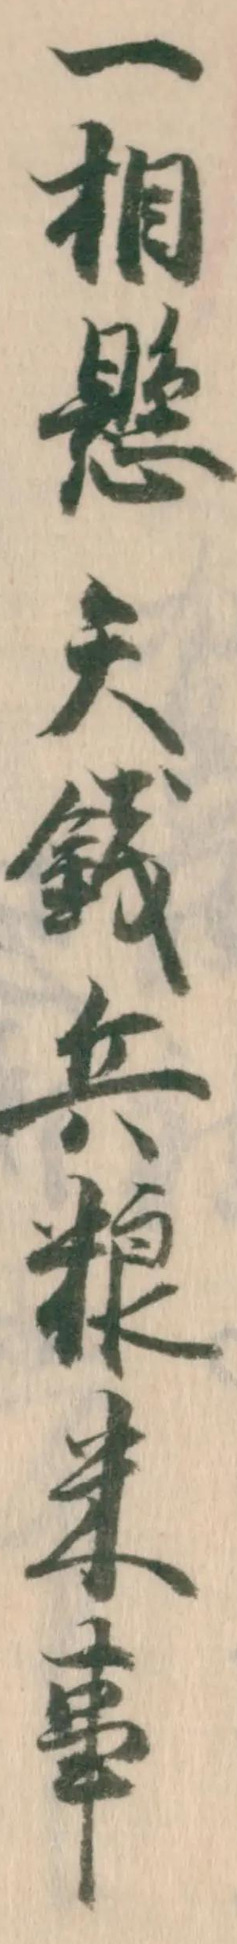一相懸矢銭兵粮米事
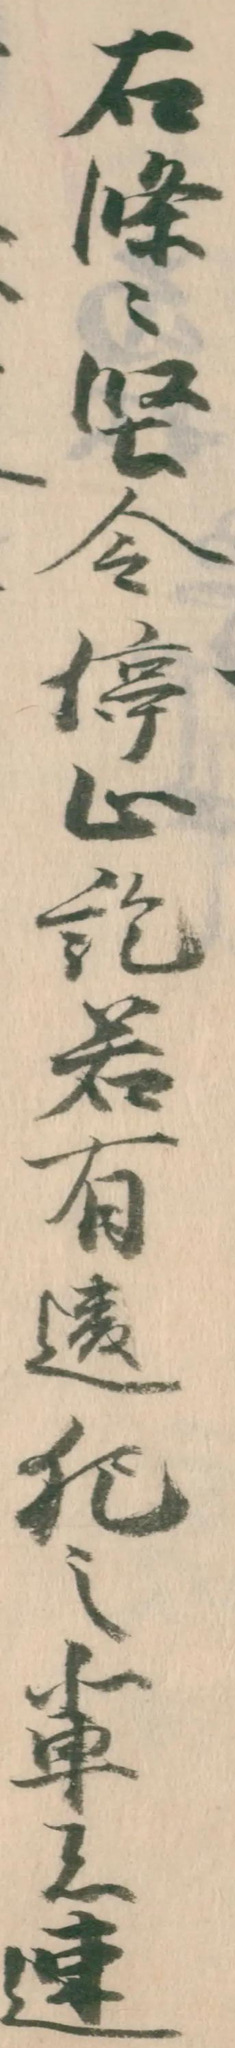右条々堅令停止訖若有違犯之輩者速
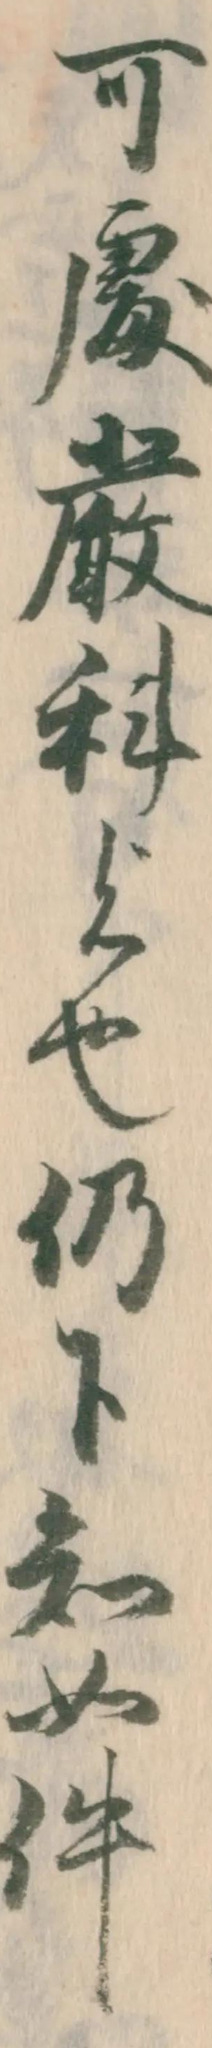可処厳科者也仍下知如件
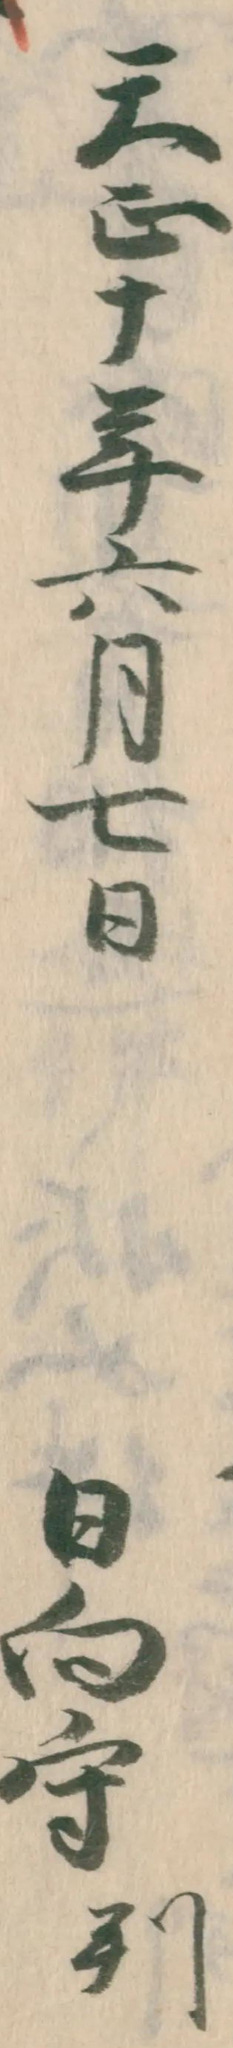天正十年六月七日日向守判

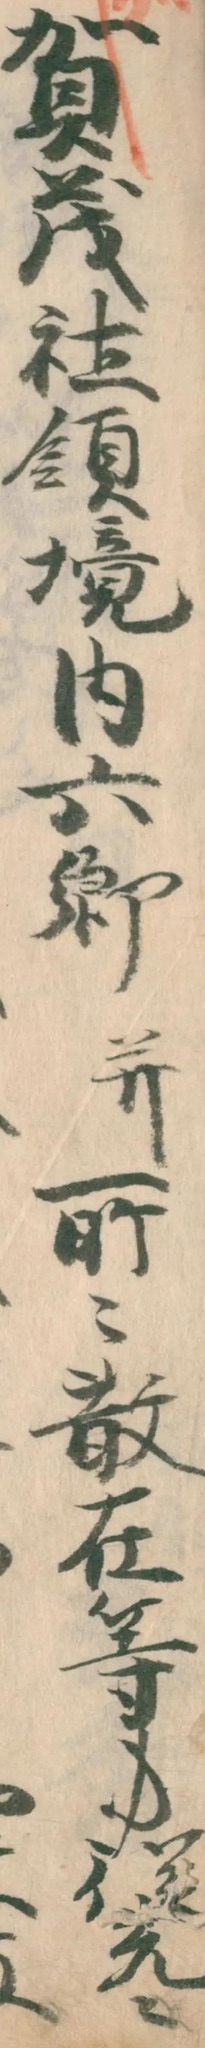賀茂社領境内六郷并所々散在等事従先々
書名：賀茂社記録. 第1冊
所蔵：国立国会図書館 National Diet Library, JAPAN
